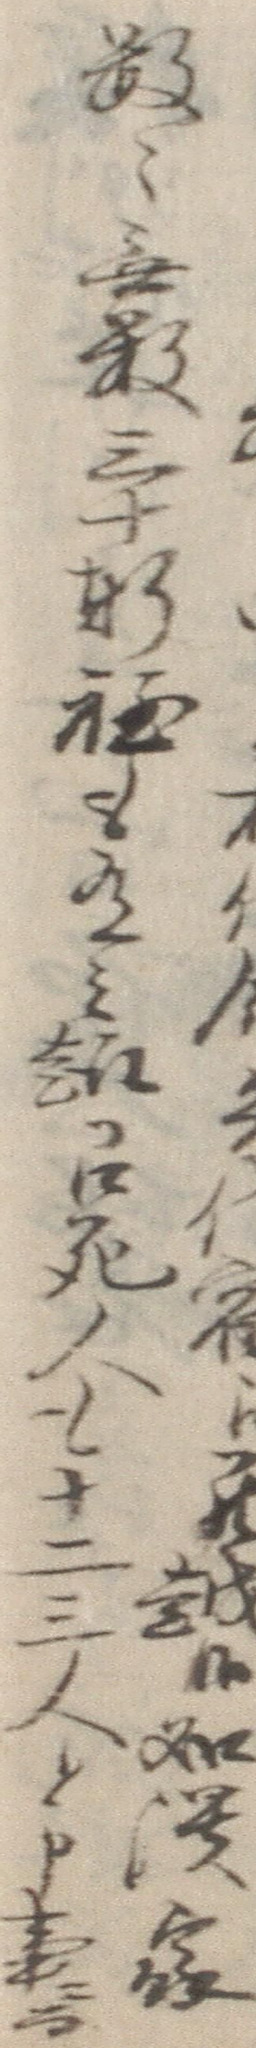数之無数三十軒程も有之趣即死人も十二三人と申事ニ而
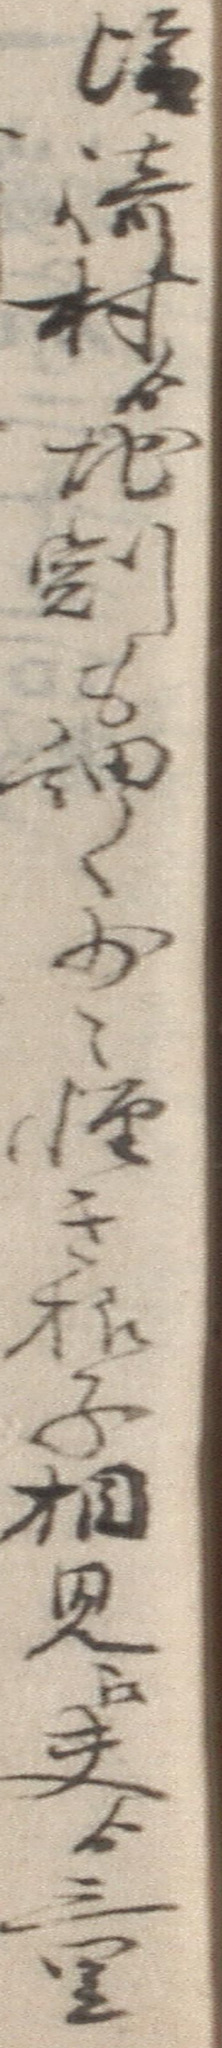塩崎村ゟ地割も細く少々軽き様子相見え夫ゟ三里
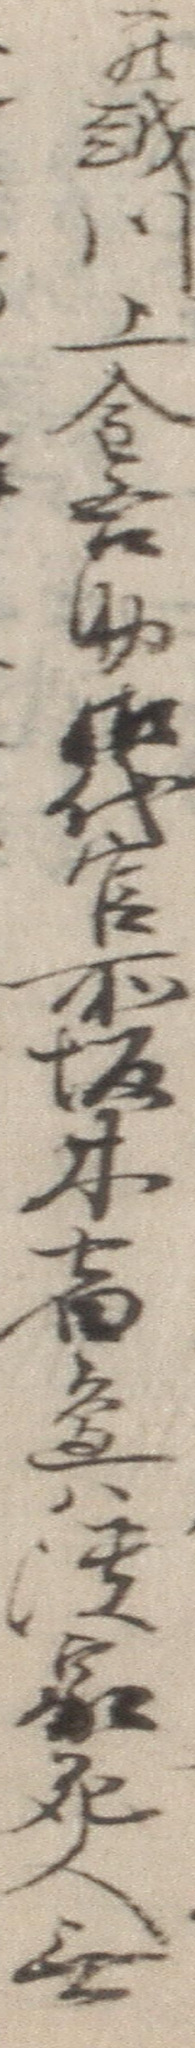罷越川上金吾助御代官所坂木宿辺ハ潰家死人無
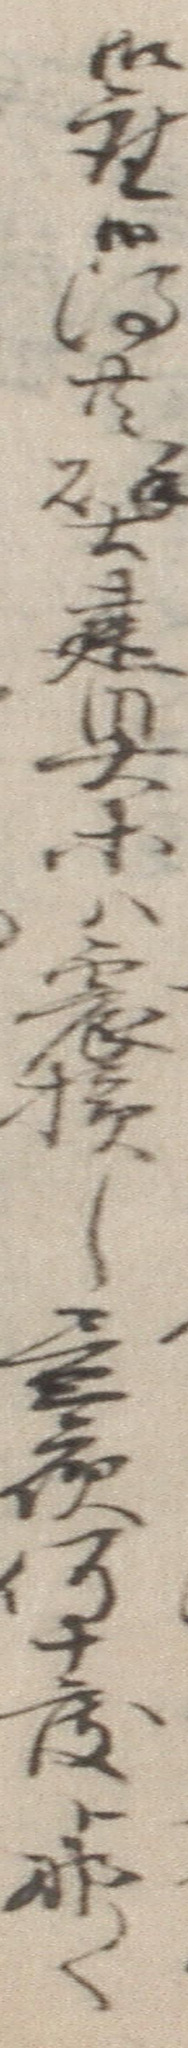御座候得共壁建具等ハ震損昼夜何十度トなく
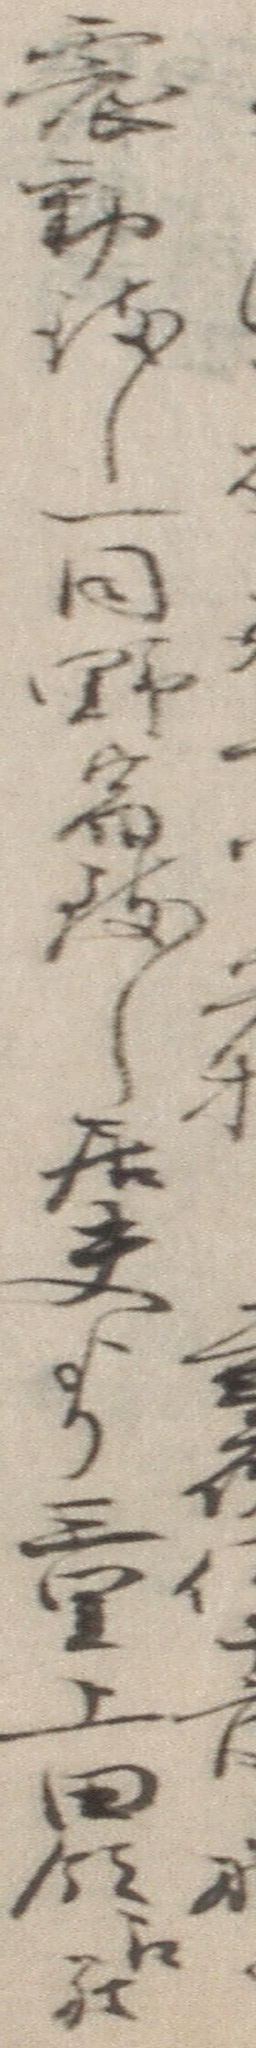震動致し一同野宿致し居夫より三里上田領え罷
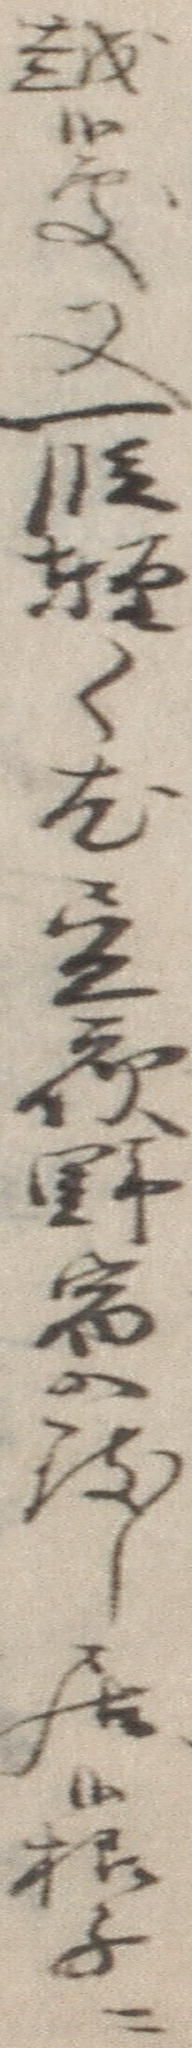越候処又一段軽く尤昼夜野宿ハ致し居候様子ニ
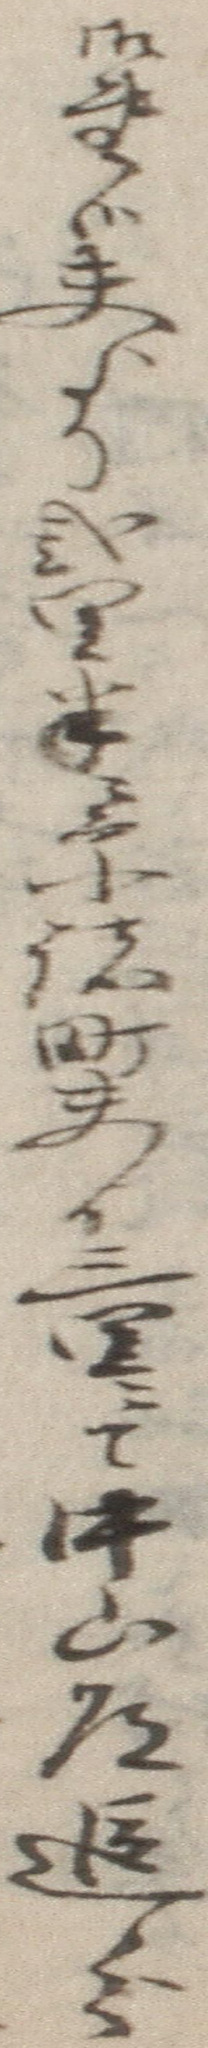御座候夫より弐里半ニ而小諸町夫ゟ三里ニて中山道追分
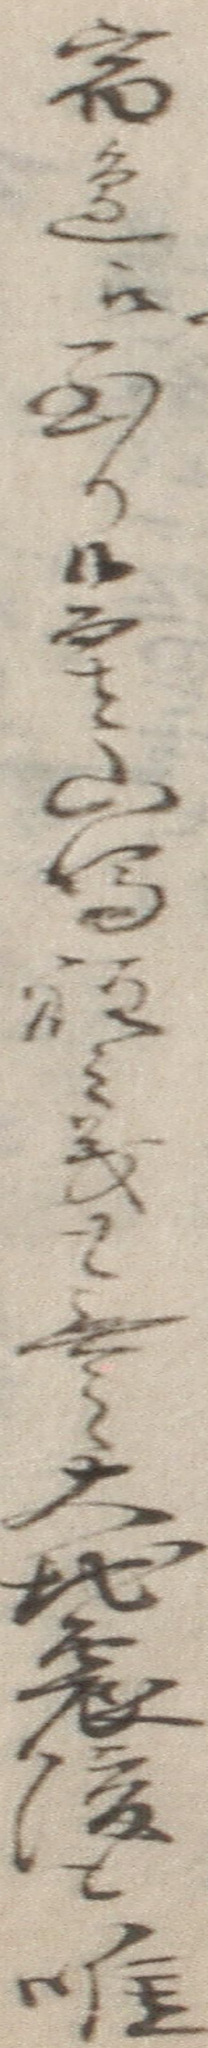宿辺え至り候而は山鳴程之義も無之大地震後も唯
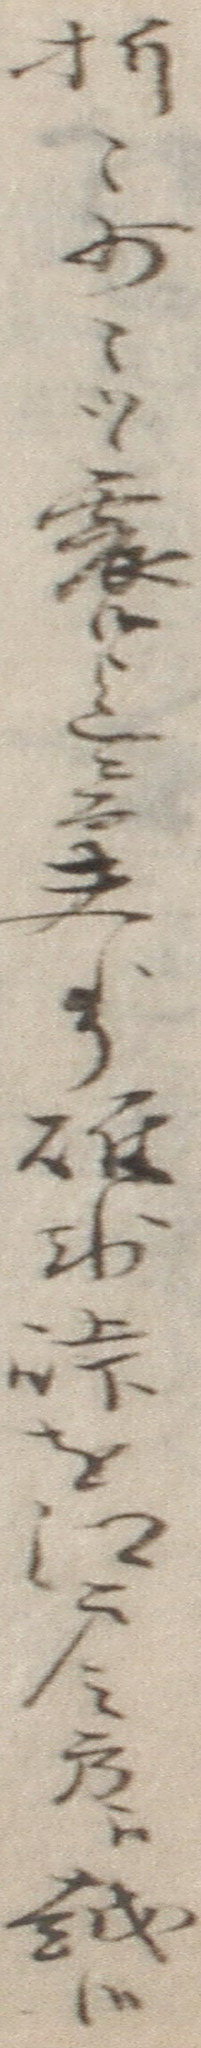折々少々ツヽ震候迄ニ而夫より碓氷峠を江戸之方え越候
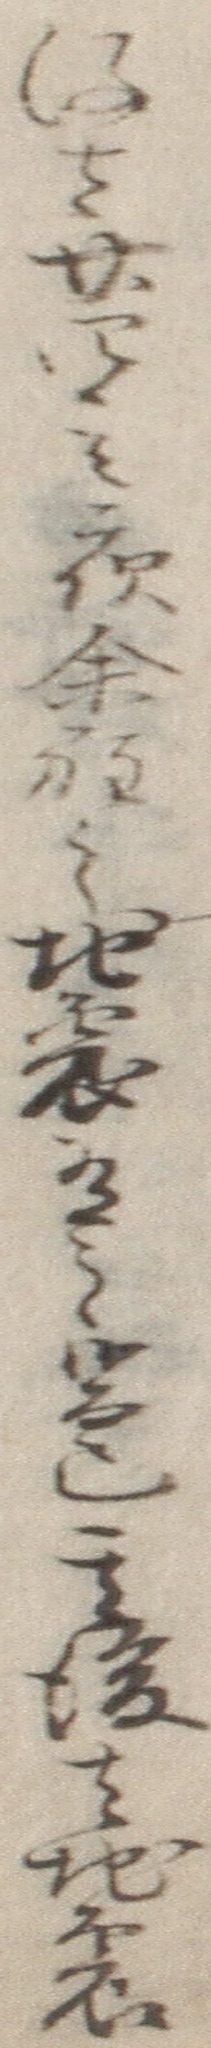得は廿四日は夜余程之地震有之候而已其後其地震
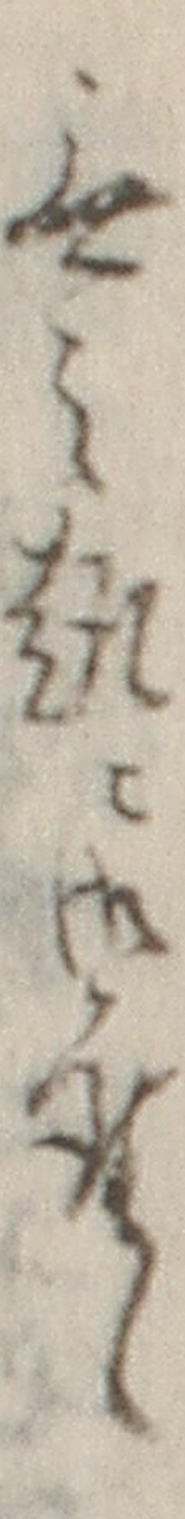無之趣ニ御座候
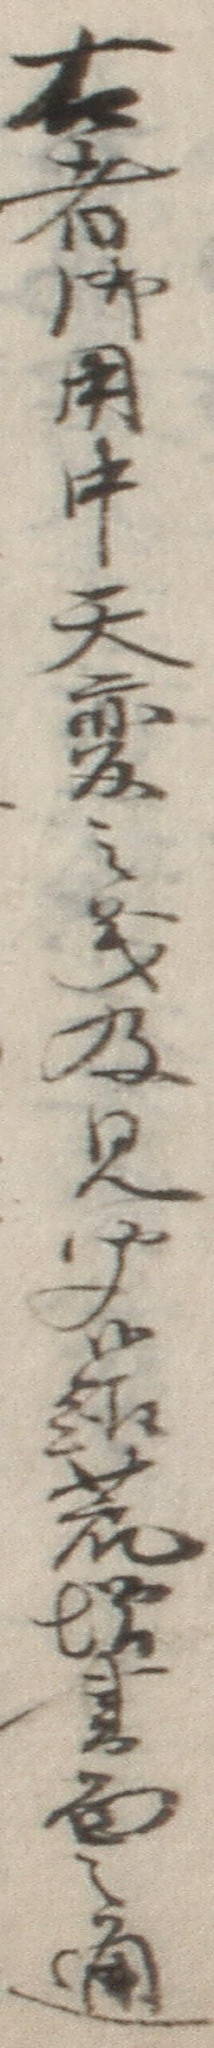右は御用中天変之義及見聞候趣荒増書面之通
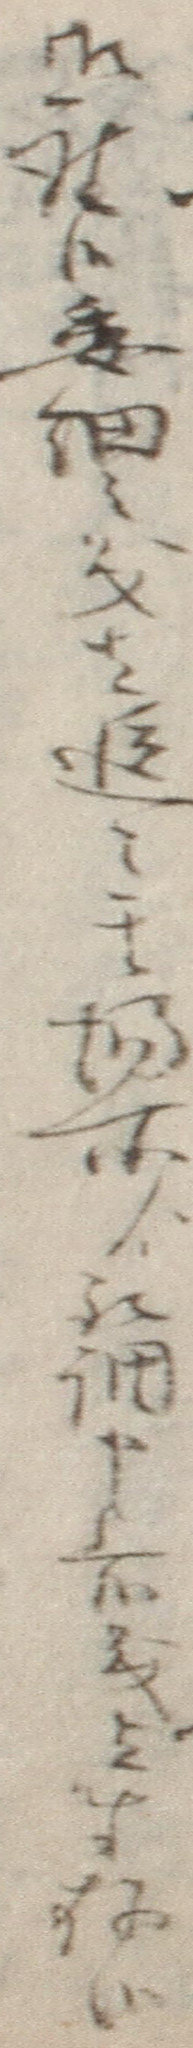御座候委細之義は追々其場所ゟ取調申上候義と奉存候
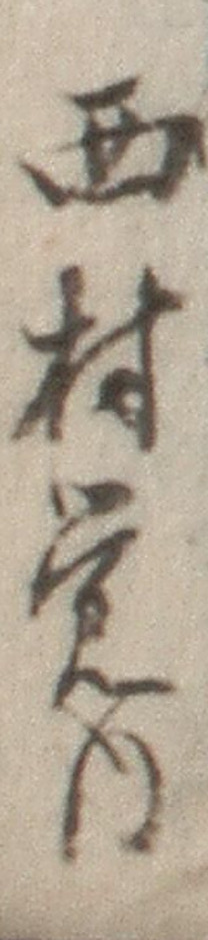西村覚内

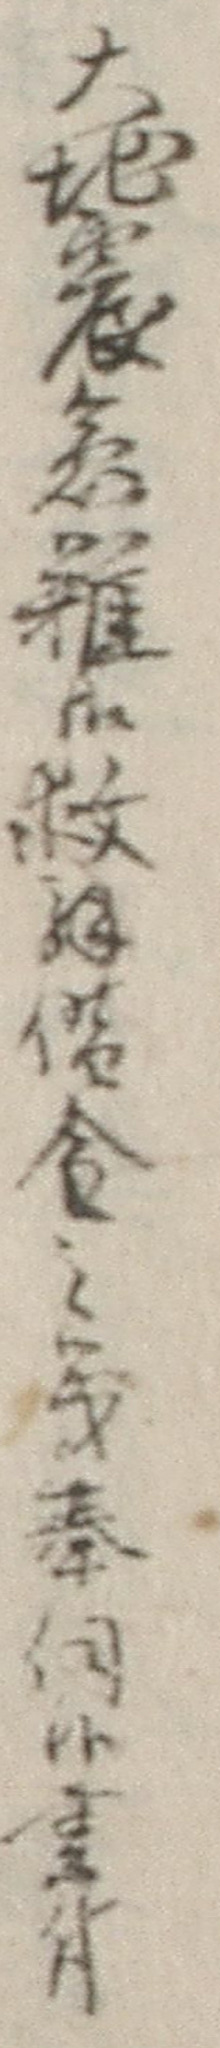大地震急難御救拝借金之義奉伺候書付
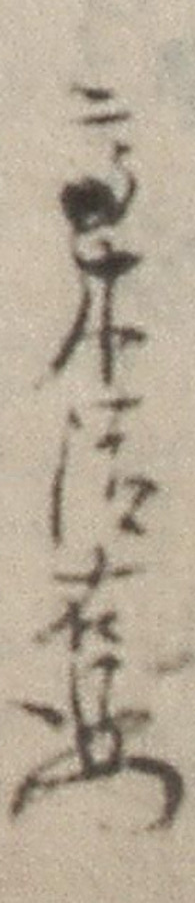高木清左衛門
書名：[善光寺地震に関する冊子]
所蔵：東京大学地震研究所図書室 Earthquake Research Institute Library, The University of Tokyo, JAPAN
